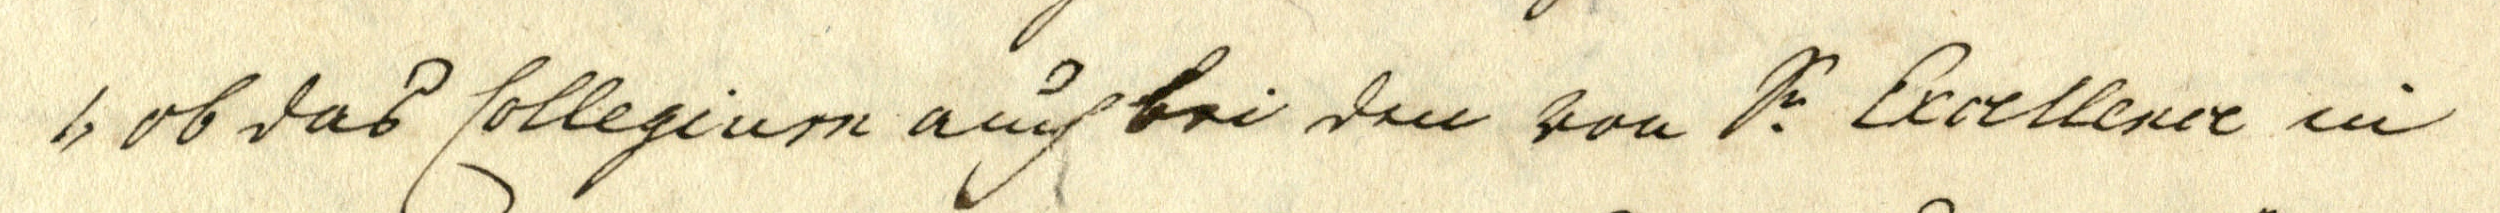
1, ob das Collegium auch bei den von Sr. Excellence in
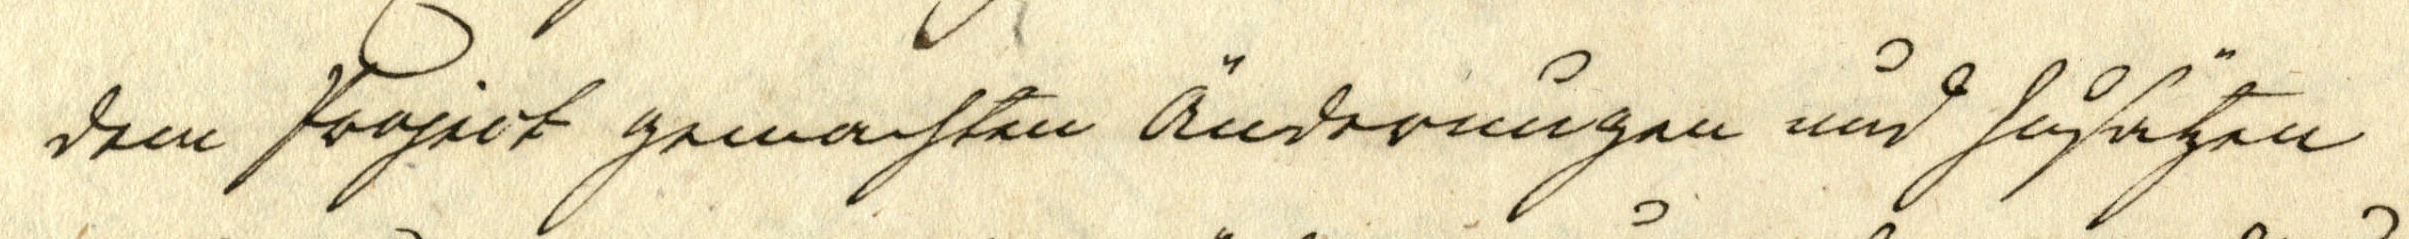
dem Project gemachten Änderungen und Zusätzen
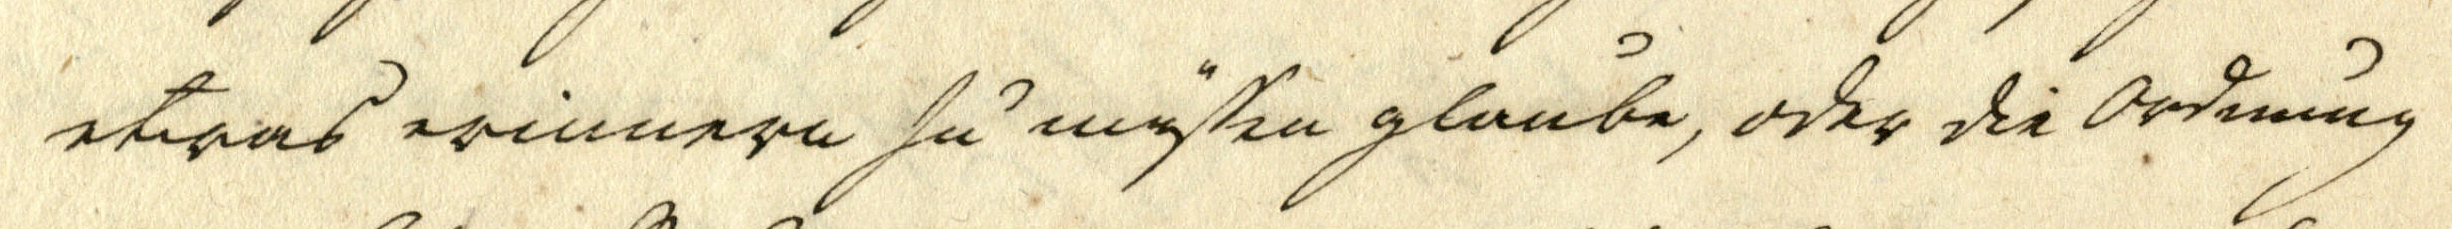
etwas erinnern zu müssen glaube, oder die Ordnung
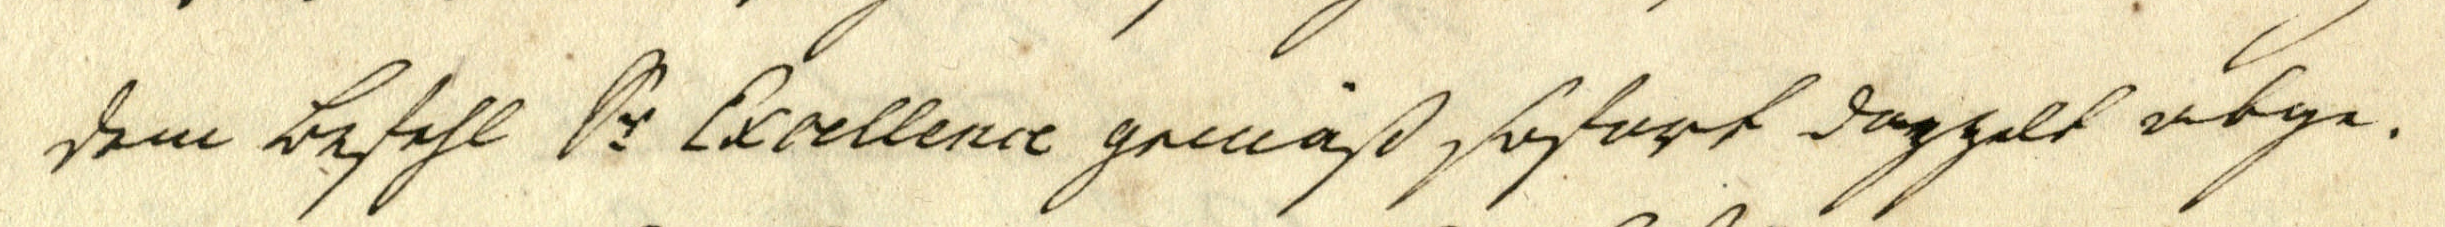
dem Befehl Sr. Excellence gemäß sofort doppelt abge¬
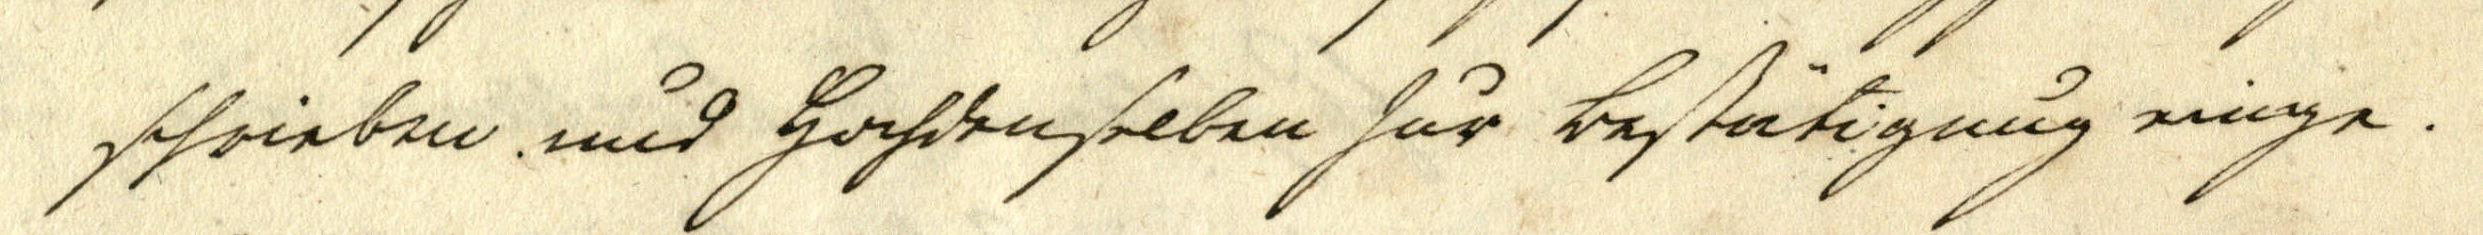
schrieben und Hochdenselben zur Bestätigung einge¬
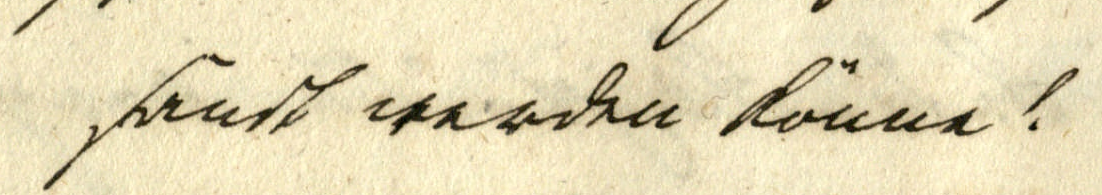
sandt werden könne?
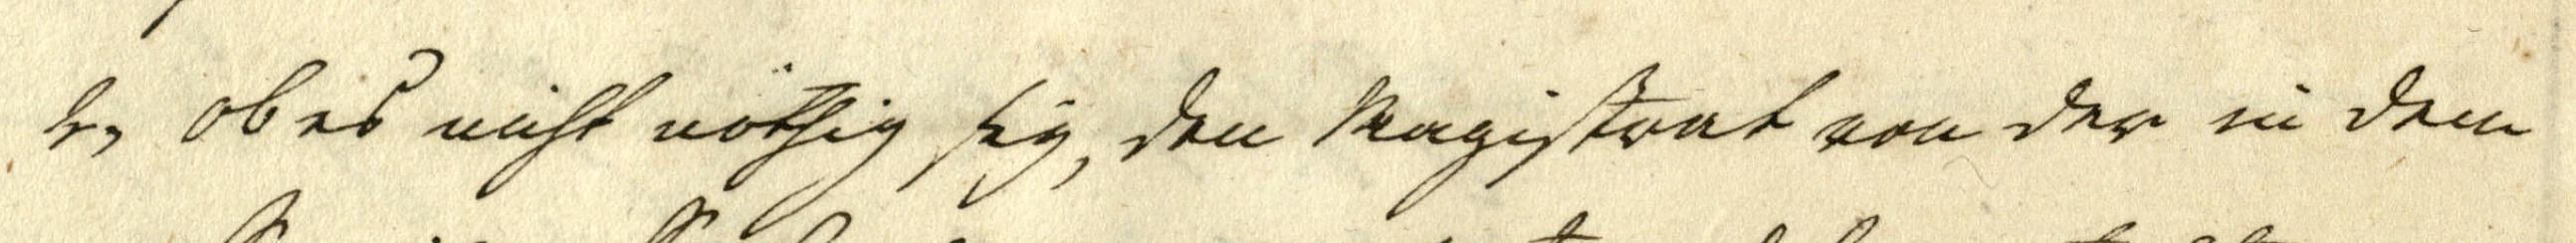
2, ob es nicht nöthig seÿ, den Magistrat von der in dem
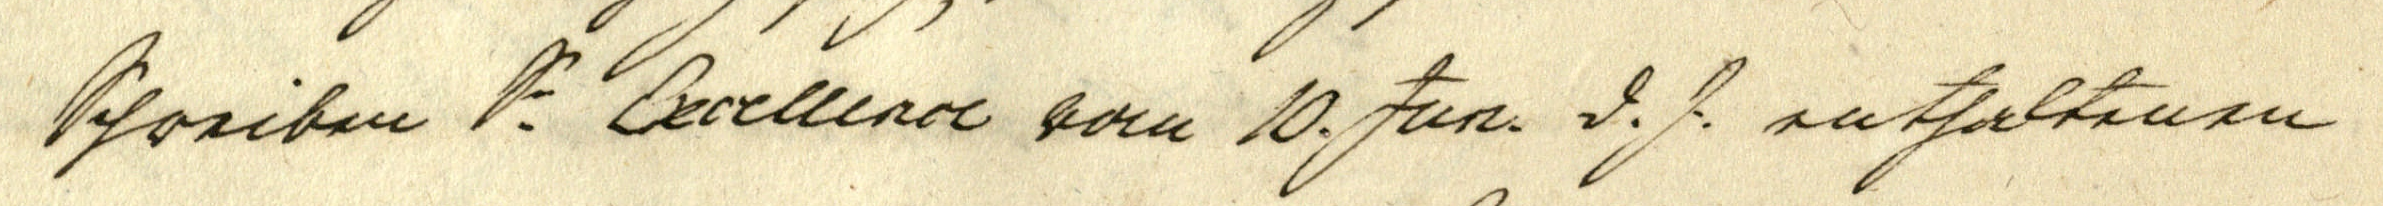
Schreiben Sr. Excellence vom 10. Jun. d. J. enthaltenen
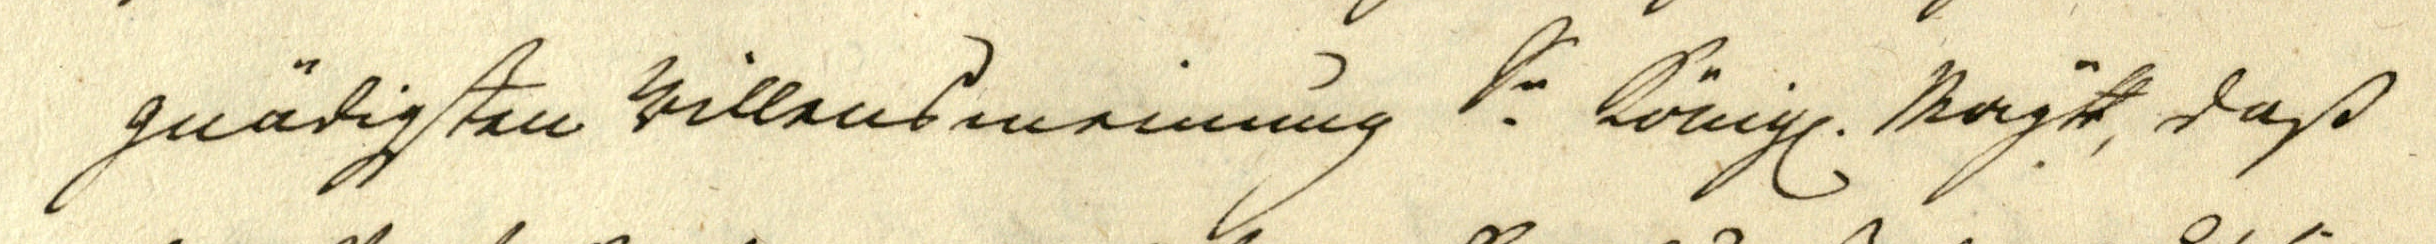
gnädigsten Willensmeinung Sr. Königl. Maÿtt. daß
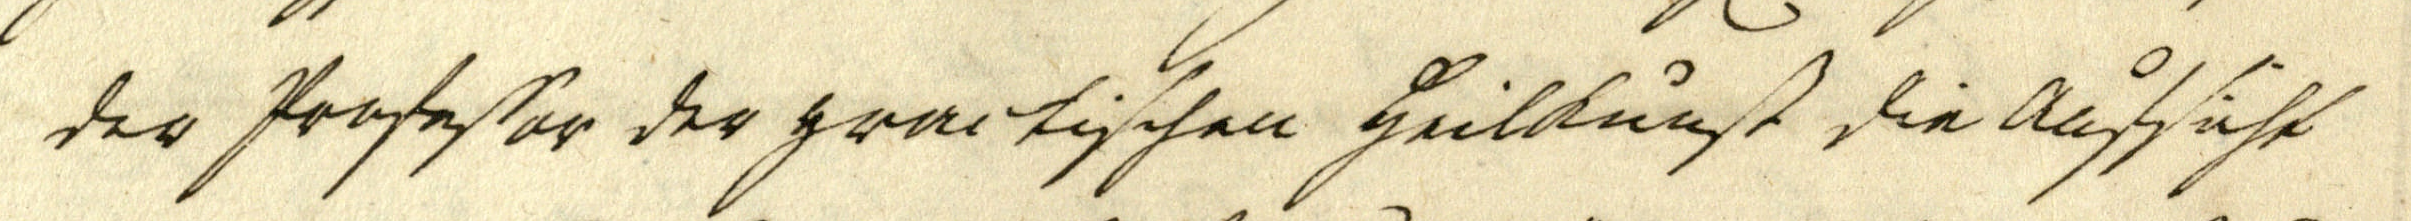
der Professor der practischen Heilkunst, die Aufsicht
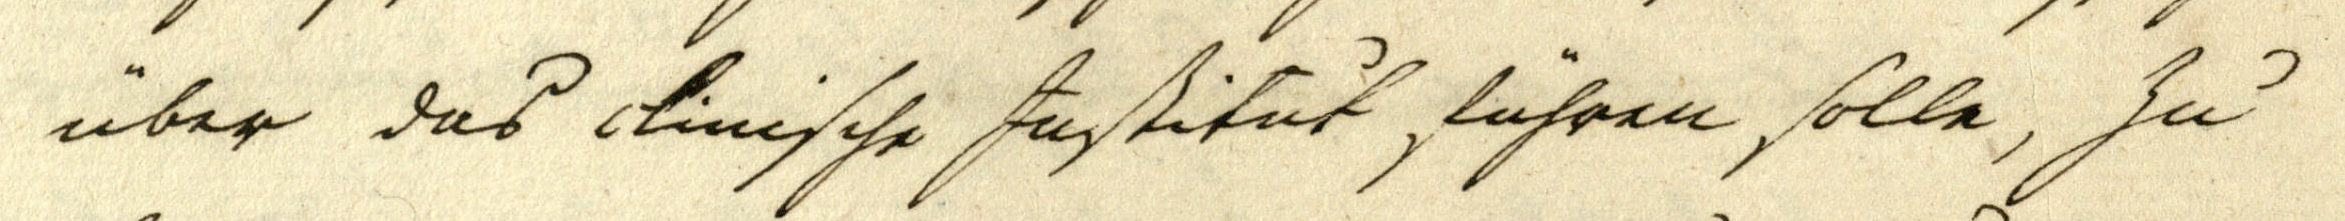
über das clinische Institut führen solle, zu
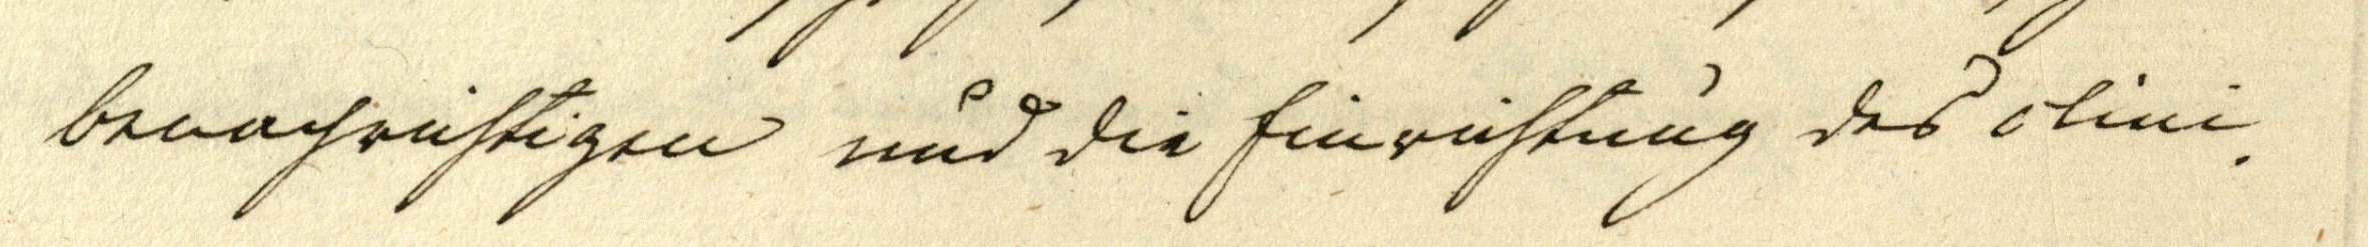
benachrichtigen und die Einrichtung des clini¬
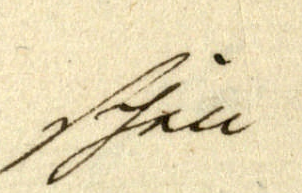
schen
